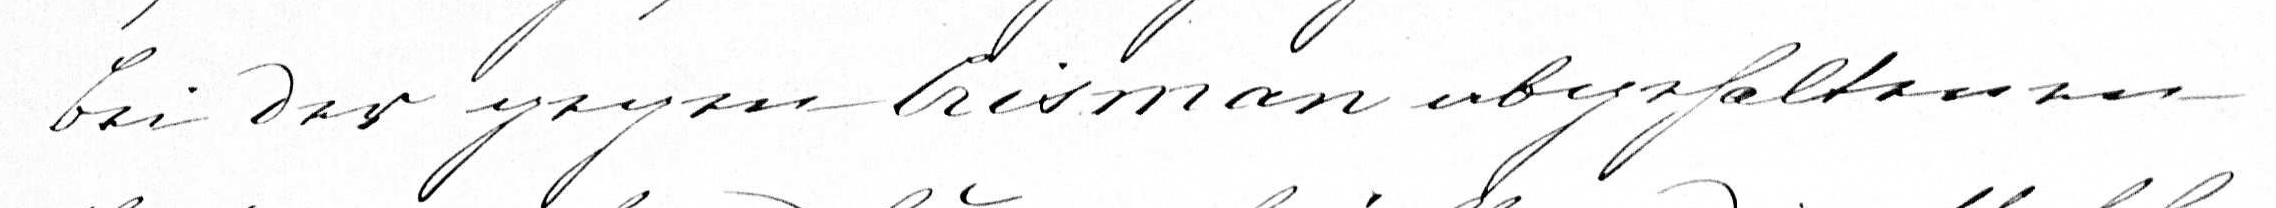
Bei der gegen Crisman abgehaltenen
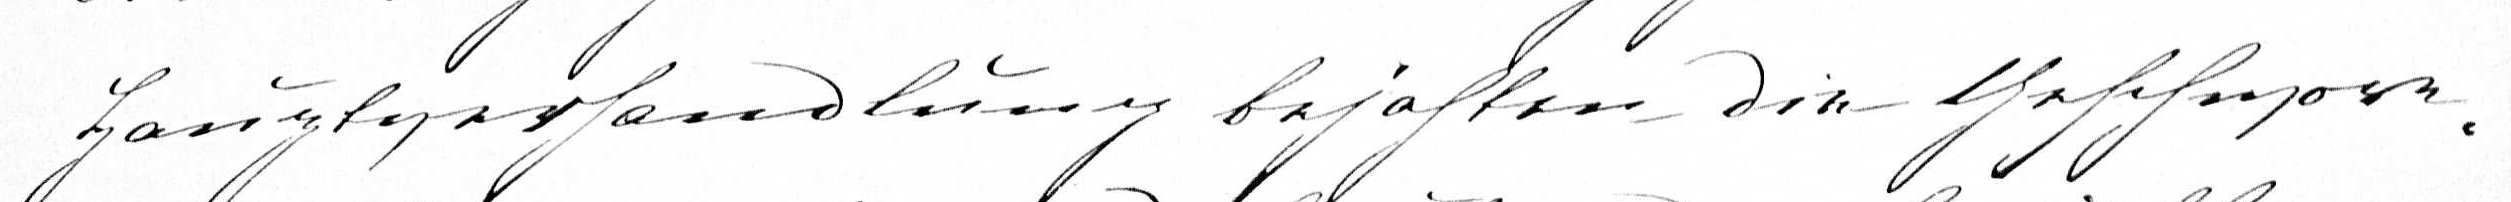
Hauptverhandlung bejahten die Geschwore¬
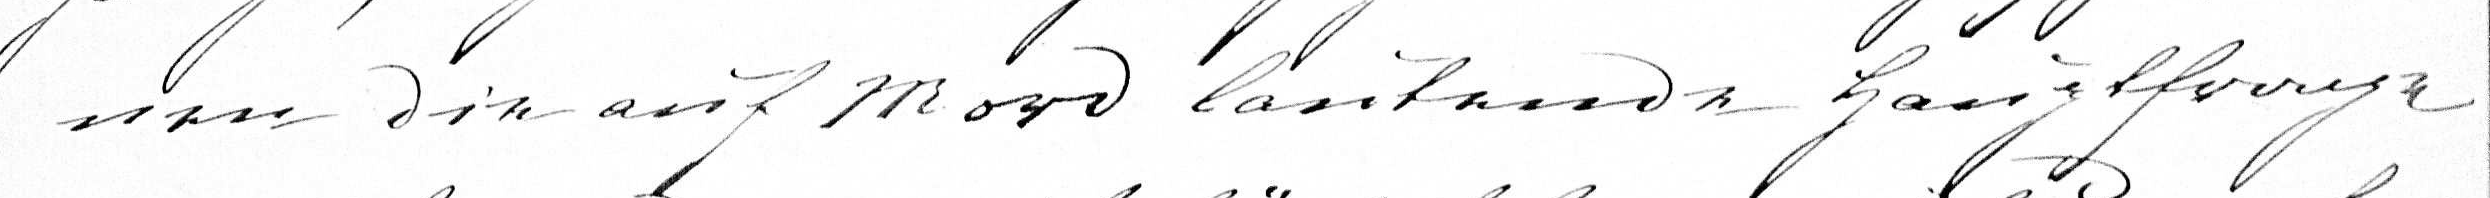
nen die auf Mord lautende Hauptfrage
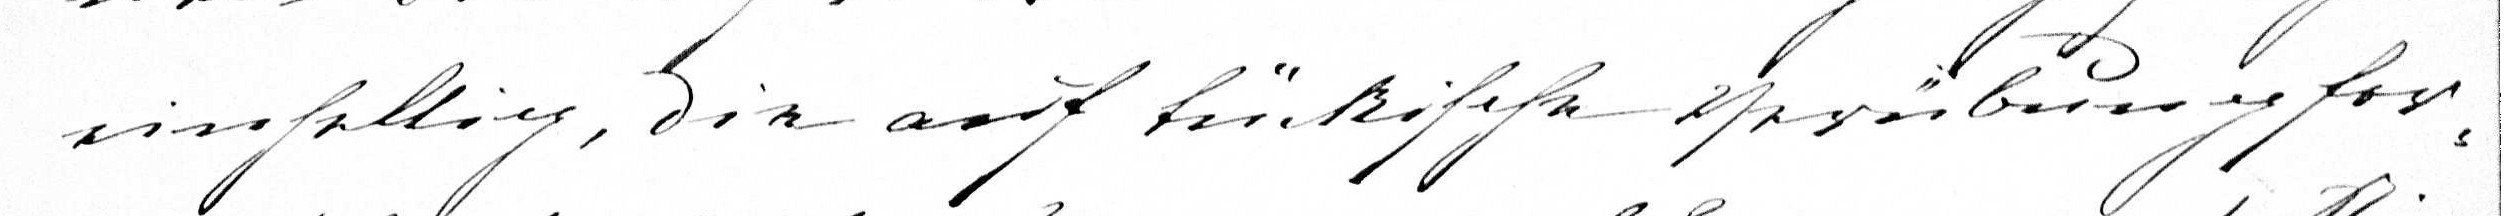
einhellig, die auf tückische Verübung for¬
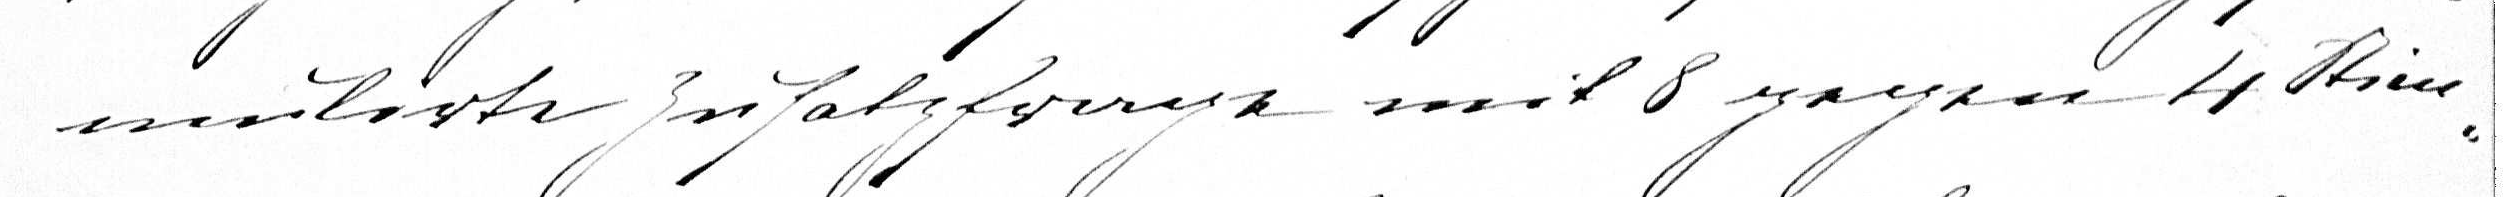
mulirte Zusatzfrage mit 8 gegen 4 Stim¬
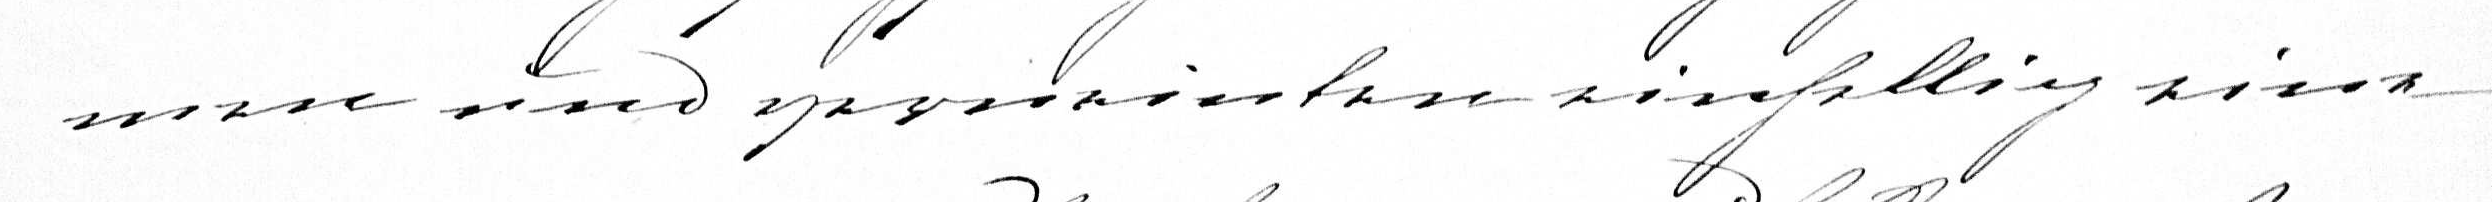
men und verneinten einhellig eine
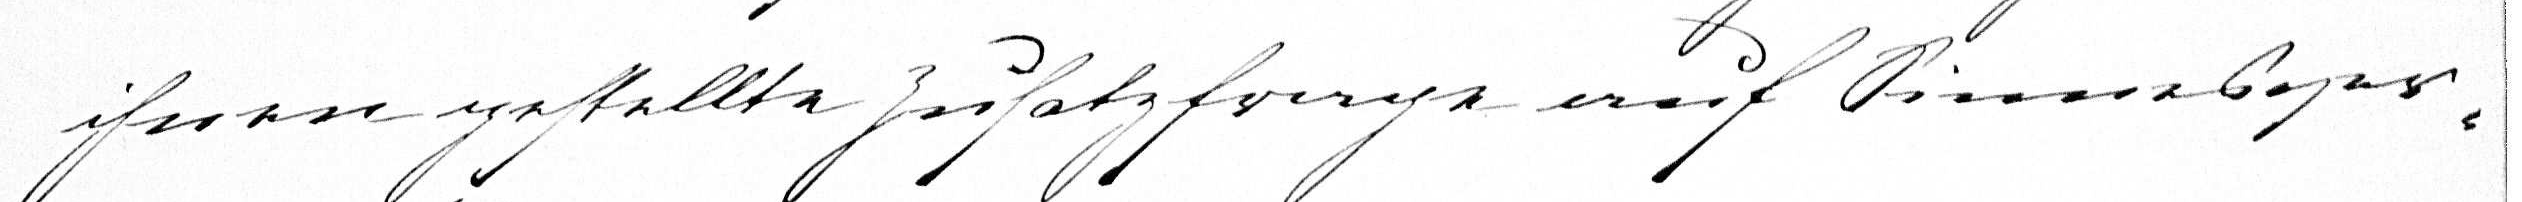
ihnen gestellte Zusatzfrage auf Sinnesver¬
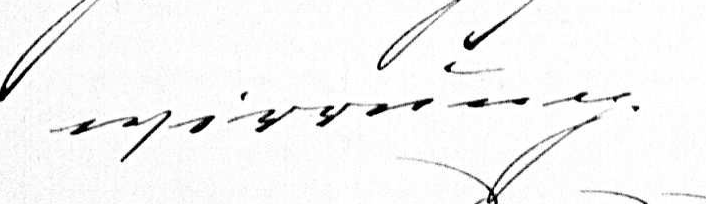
wirrung.
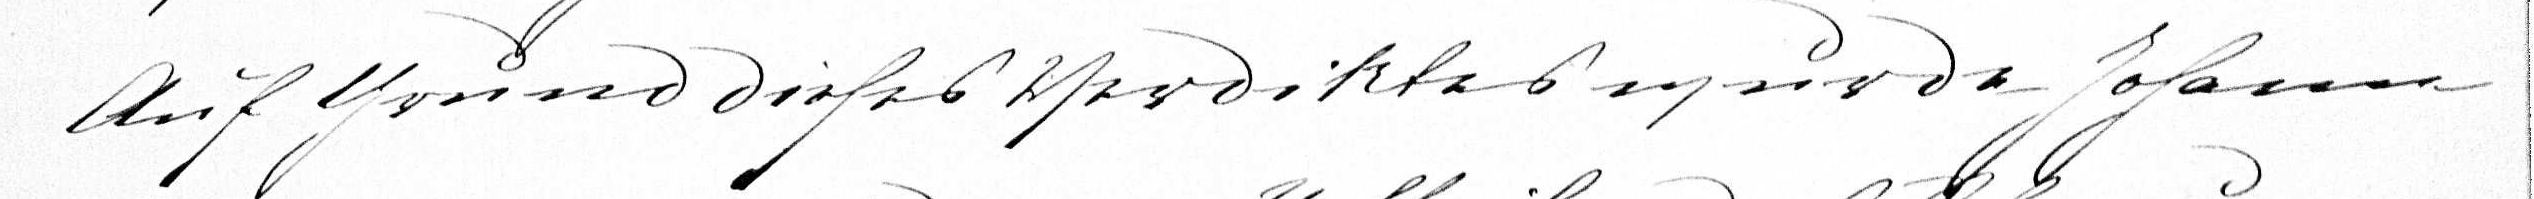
Auf Grund dieses Verdiktes wurde Johann
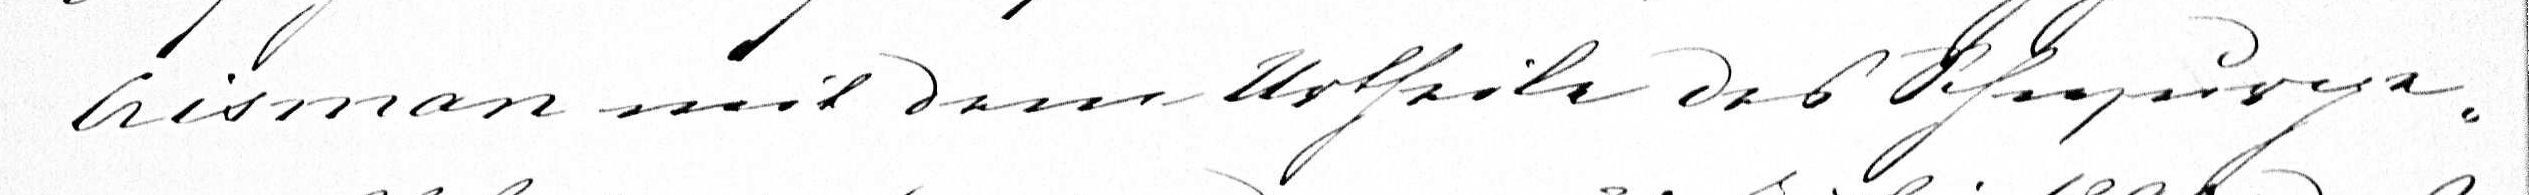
Crisman mit dem Urtheile des Schwurge¬
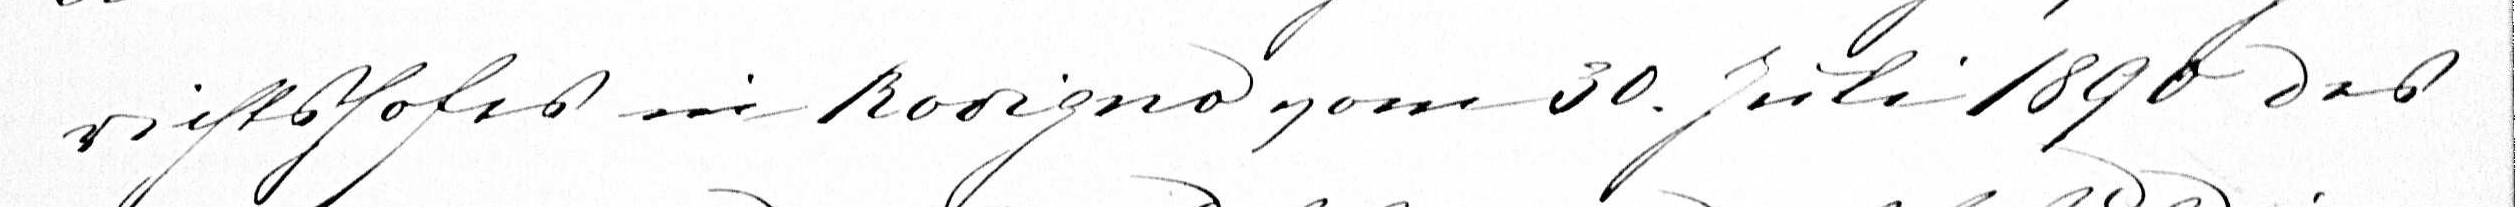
richtshofes in Rovigno vom 30. Juli 1890 des
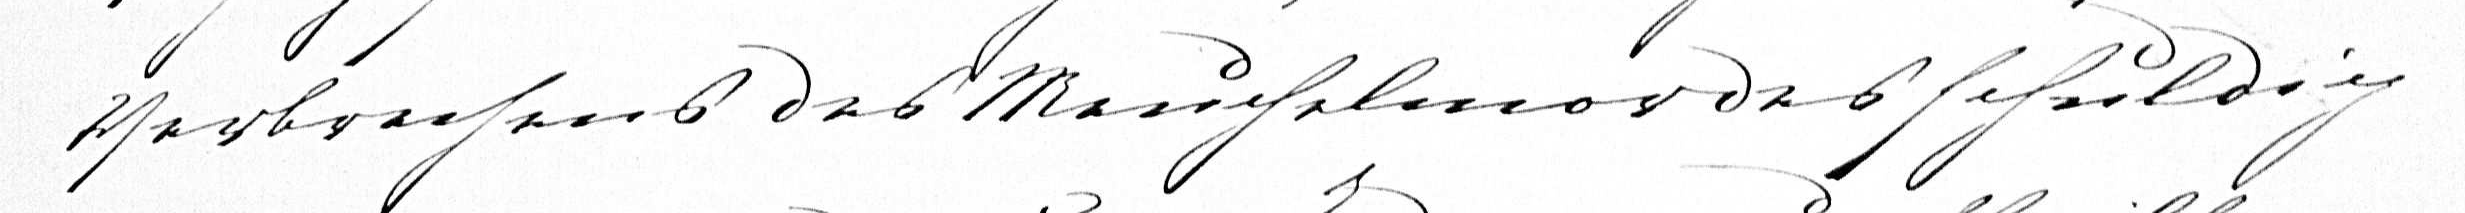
Verbrechens des Meuchelmordes schuldig
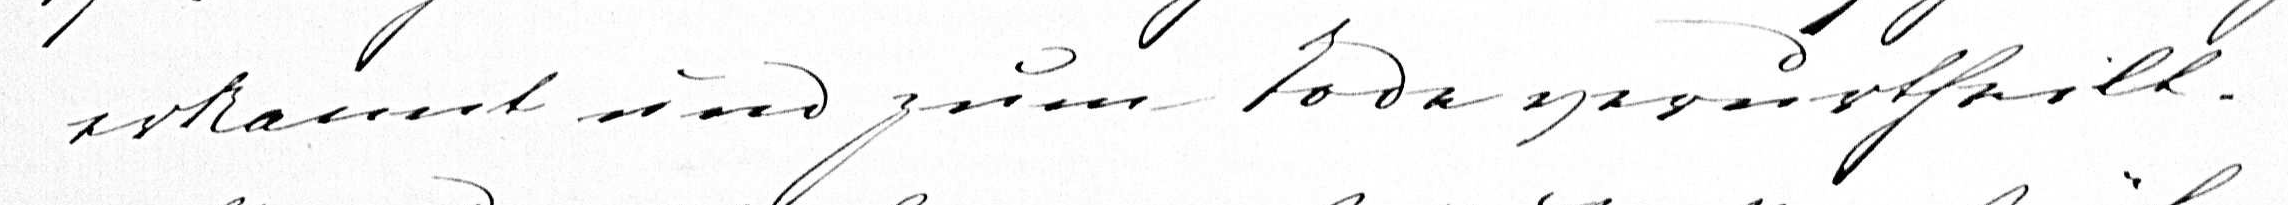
erkannt und zum Tode verurtheilt.
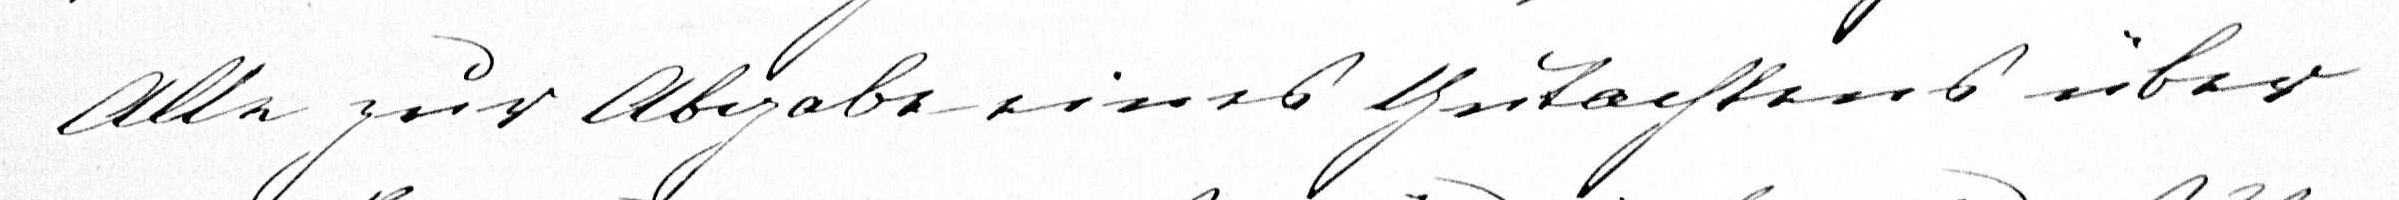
Alle zur Abgabe eines Gutachtens über
